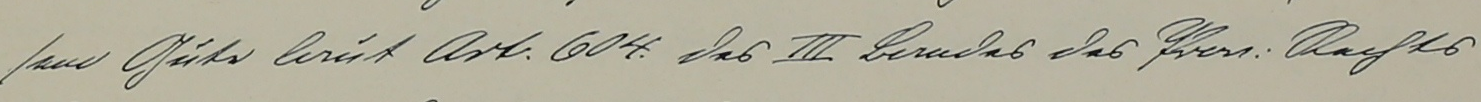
sem Gute laut Art. 604. des III Bandes des Prov. Rechts
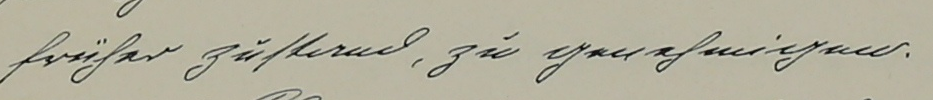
früher zustand, zu genehmigen.
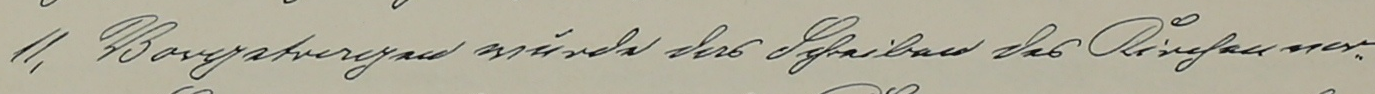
11. Vorgetragen wurde das Schreiben des Kirchenvor-
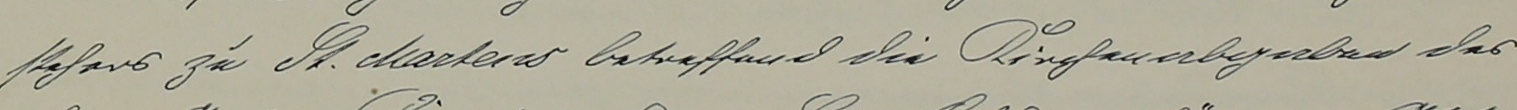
stehers zu St. Martens betreffend die Kirchenabgaben des
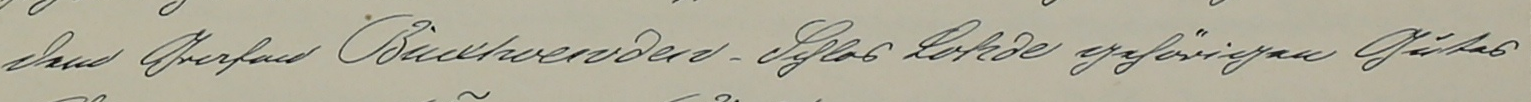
dem Grafen Buxhoewden-Schlos Lohde gehörigen Gutes
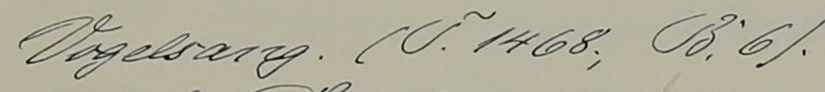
Vogelsang. (T.1468; B.6).
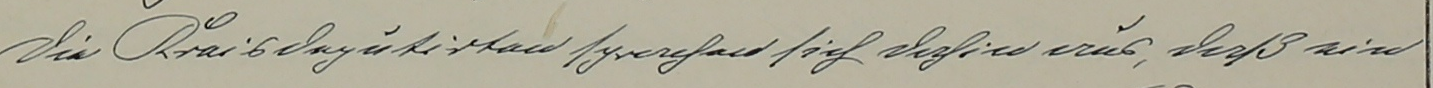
Die Kreisdeputirten sprachen sich dahin aus, daß ein
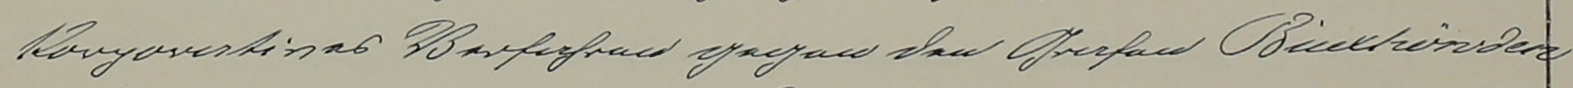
korporatives Verfahren gegen den Grafen Buxhöwden
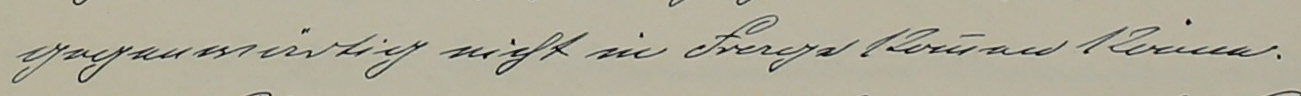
gegenwärtig nicht in Frage kommen könne.
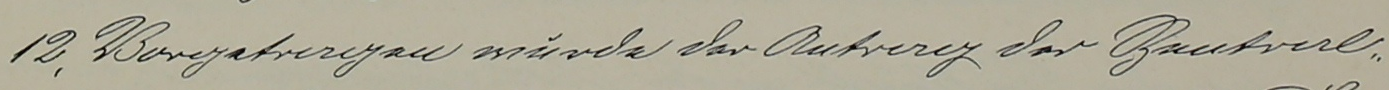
12. Vorgetragen wurde der Antrag der Zentral-
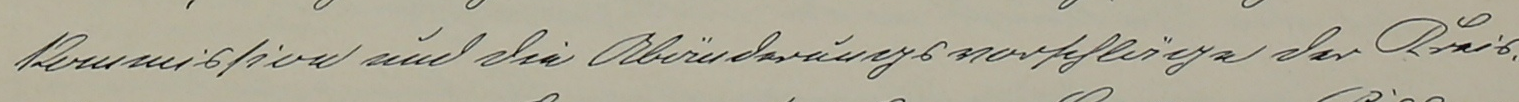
kommission und die Abänderungsvorschläge der Kreis-
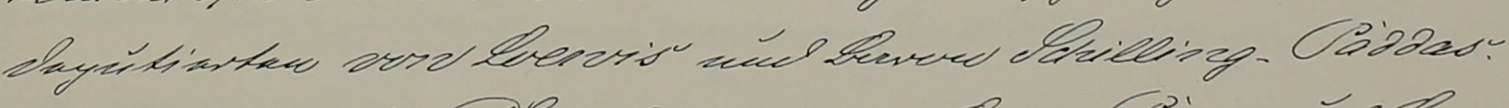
deputierten von Loewis und Baron Schilling-Paddas.
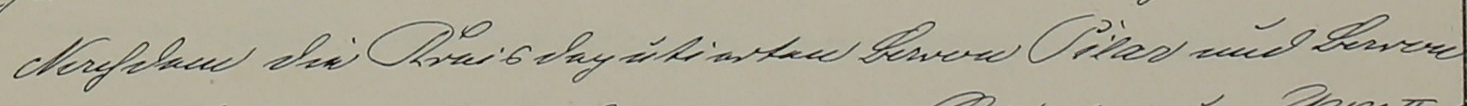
Nachdem die Kreisdeputierten Baron Pilar und Baron
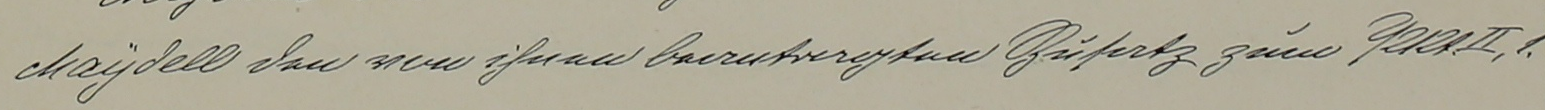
Maydell den von ihnen beantragten Zusatz zum Pkt. II,1.
